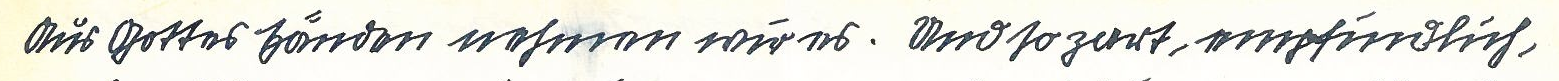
Aus Gottes Händen nehmen wir es. Und so zart, empfindlich,
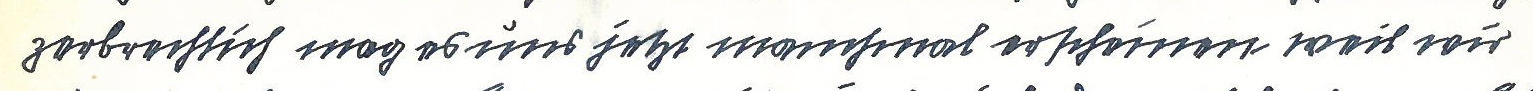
zerbrechlich mag es uns jetzt manchmal erscheinen weil wir
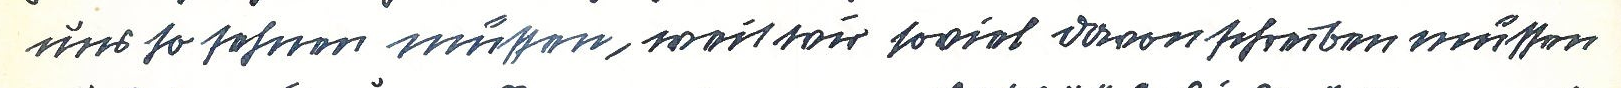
uns so sehnen müssen, weil wir soviel davon schreiben müssen
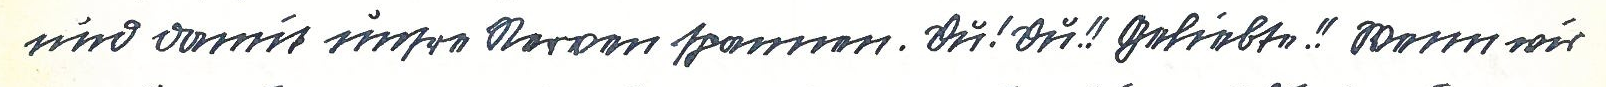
und damit unsre Nerven spannen. Du! Du!! Geliebte!! Wenn wir
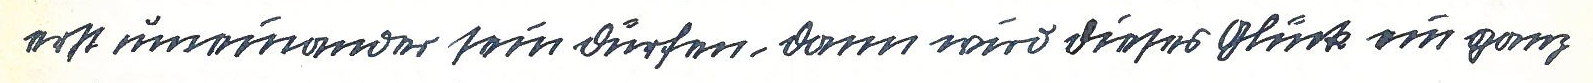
erst umeinander sein dürfen, dann wird dieses Glück ein ganz
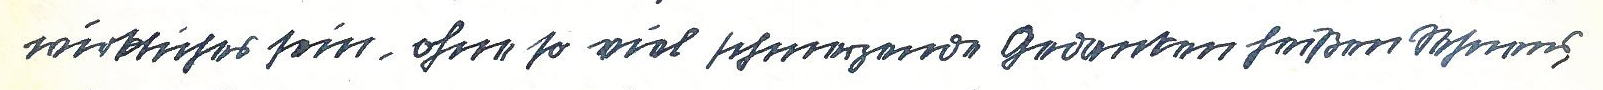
wirkliches sein, ohne so viel schmerzende Gedanken heißen Sehnens,
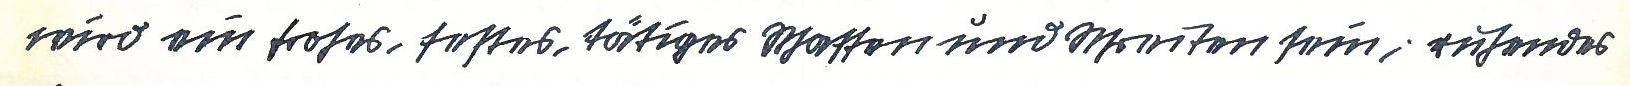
wird ein frohes, festes, tätiges Schaffen und Schreiten sein; ruhendes
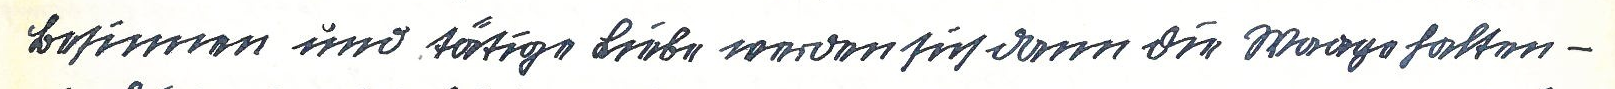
Besinnen und tätige Liebe werden sich dann die Waage halten –
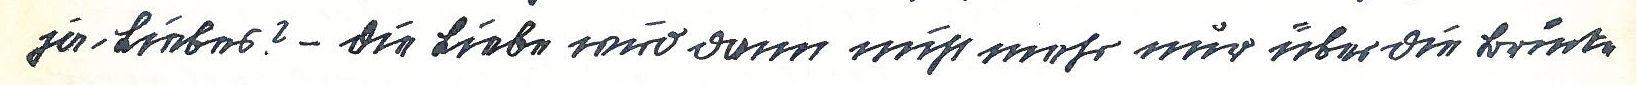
ja, Liebes? – die Liebe wird dann nicht mehr nur über die Brücke
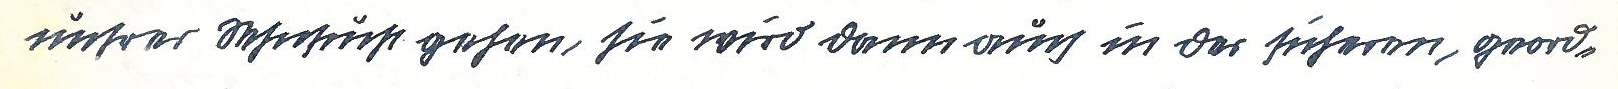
unsrer Sehnsucht gehen, sie wird dann auch in der sicheren, geord¬
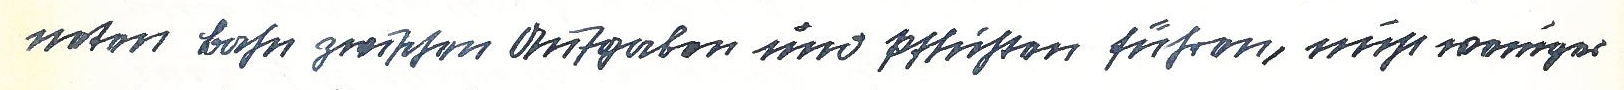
neten Bahn zwischen Aufgaben und Pflichten führen, nicht weniger
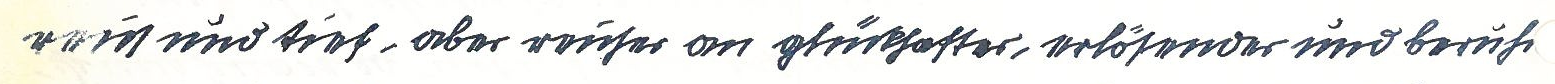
reich und tief, aber reicher an glückhafter, erlösender und beruhi¬
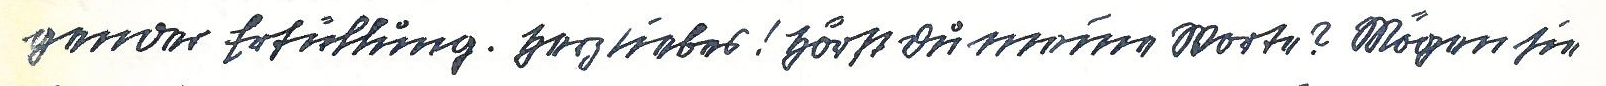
gender Erfüllung. Herzliebes! Hörst Du meine Worte? Mögen sie
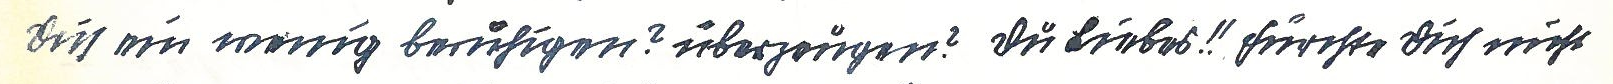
Dich ein wenig beruhigen? überzeugen? Du Liebes!! Fürchte Dich nicht
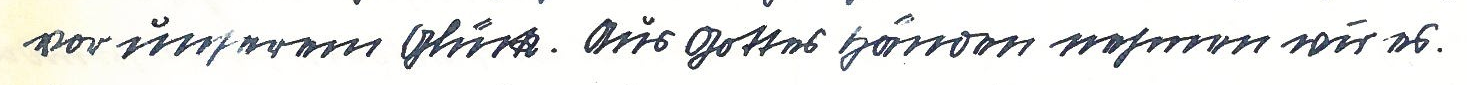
vor unserem Glück. Aus Gottes Händen nehmen wir es.
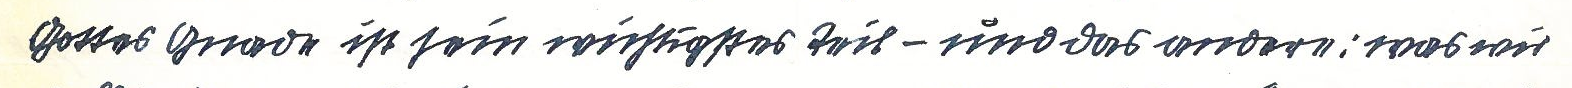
Gottes Gnade ist sein wichtigster Teil – und das andere: was wir
